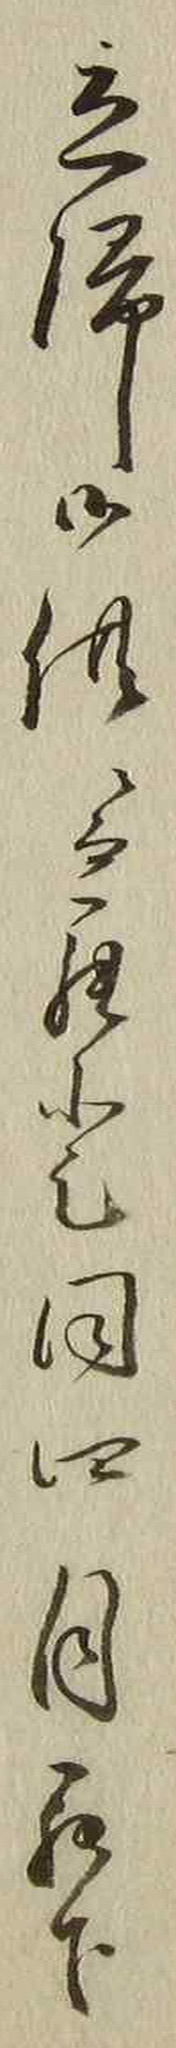立帰御供ニ而罷登同四月罷下
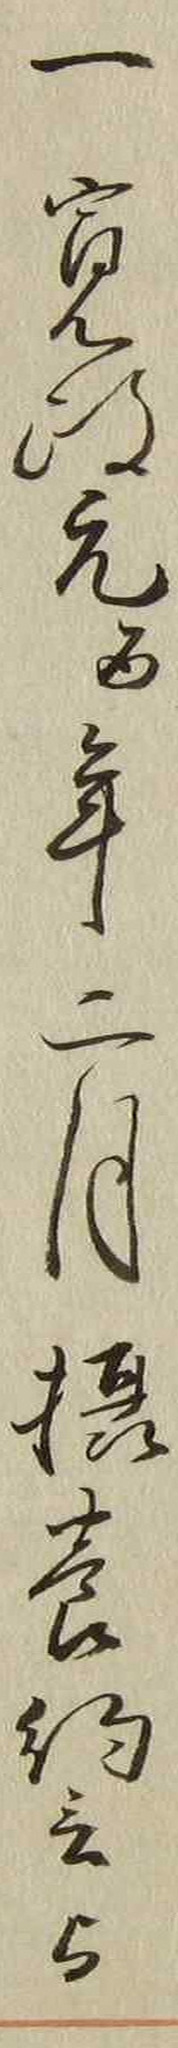一寛政元酉年二月摂養約言与
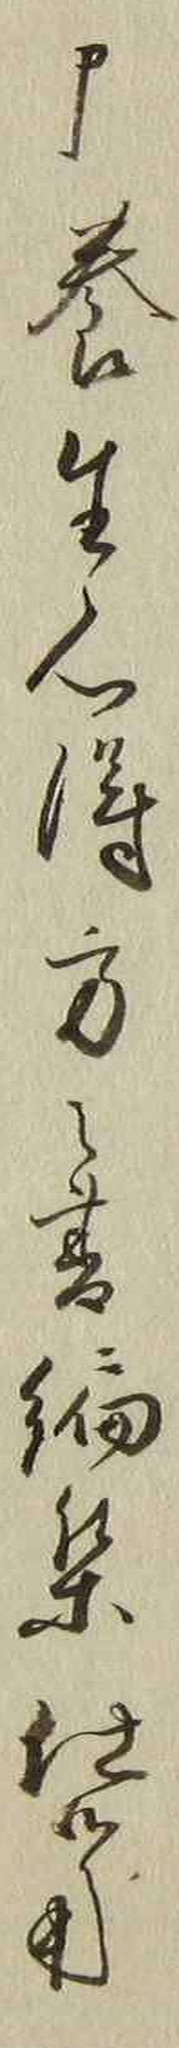申養生心得方之書編集仕御用
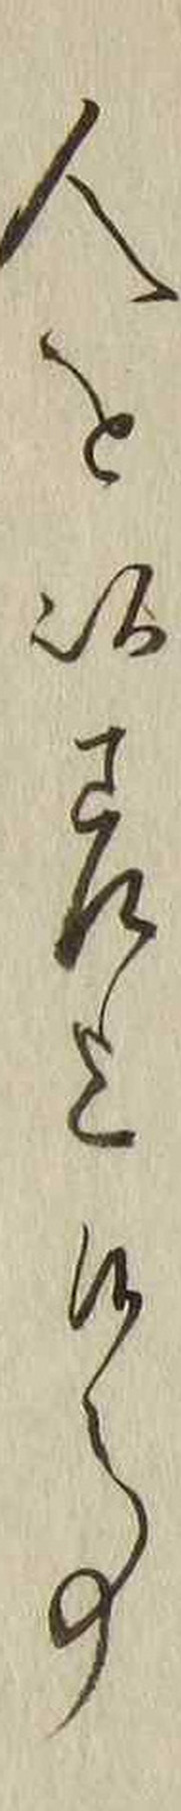人を以差上候事
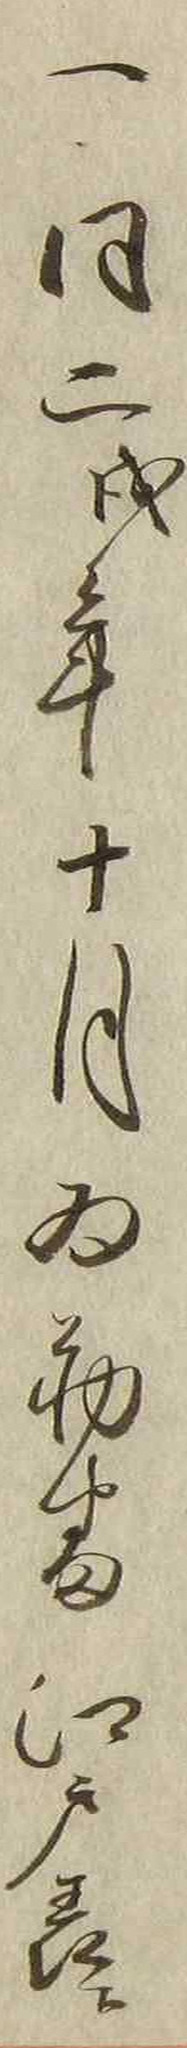一同二戌年十月為勤番江戸表江
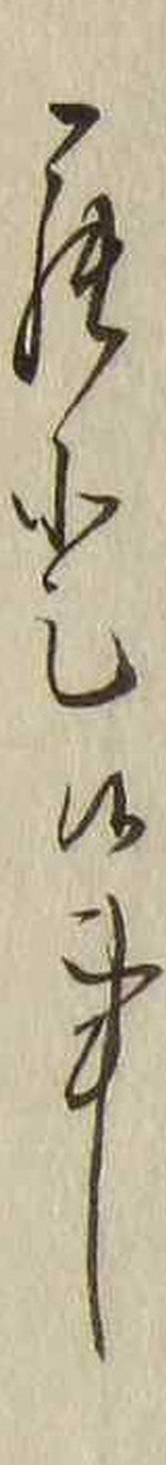罷登候事

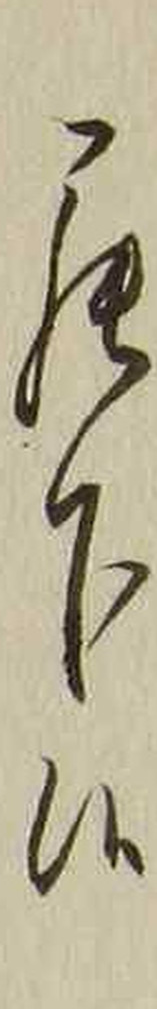罷下候
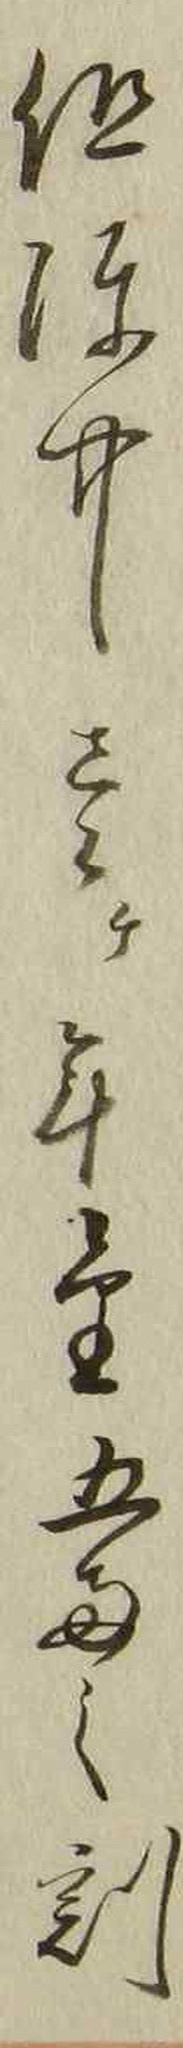但陣中壱ケ年金五両之割
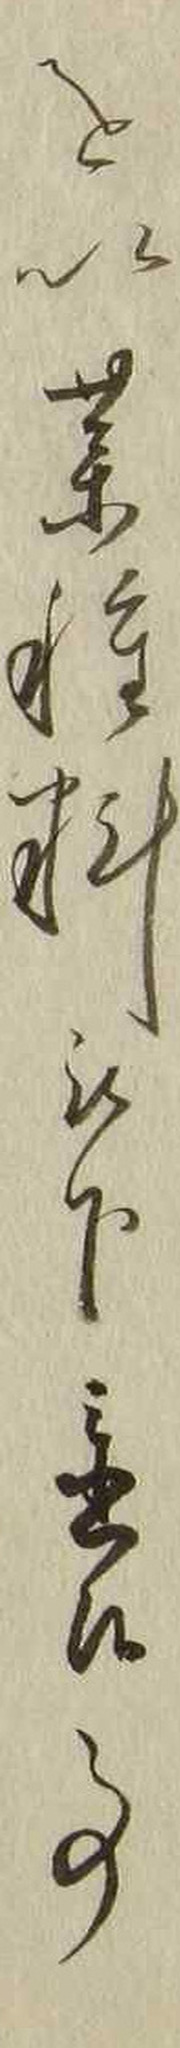を以薬種料被下置候事
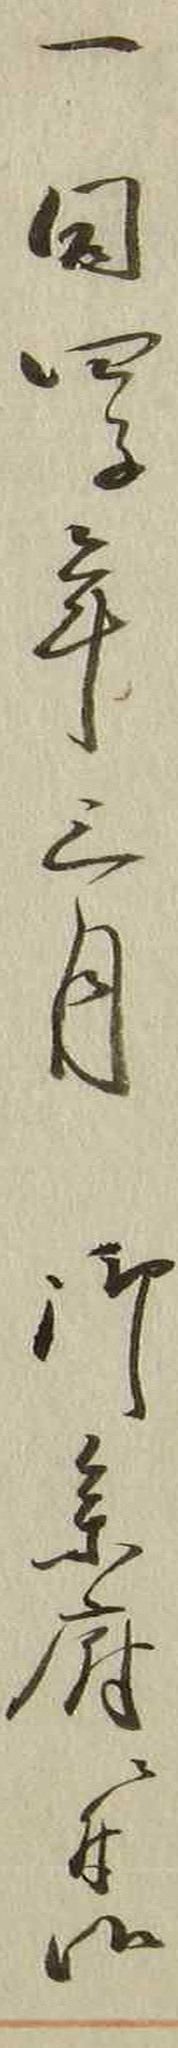一同四子年三月御参府ニ付御
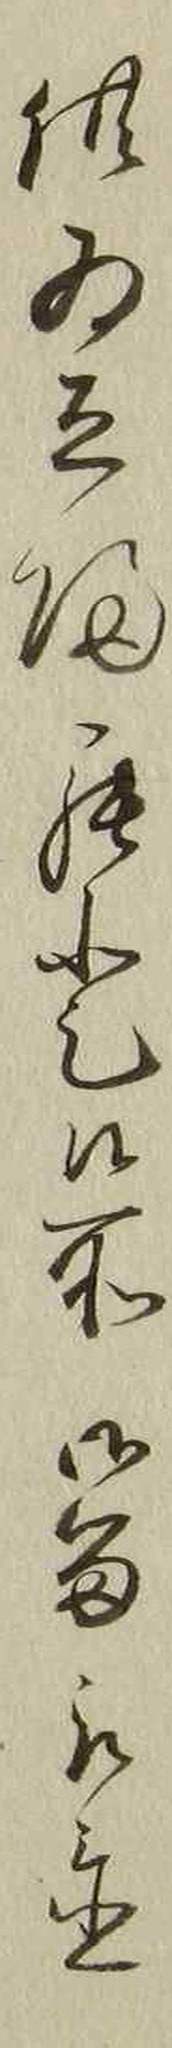供為立帰罷登候所御留被置
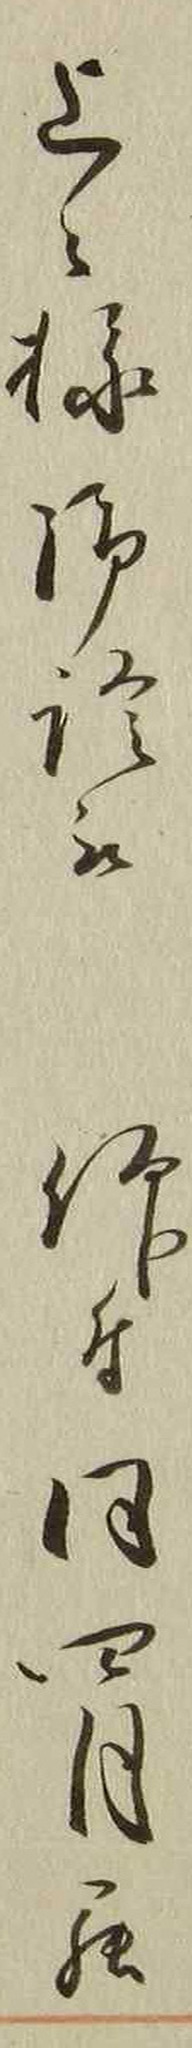上々様御診被仰付同四月罷
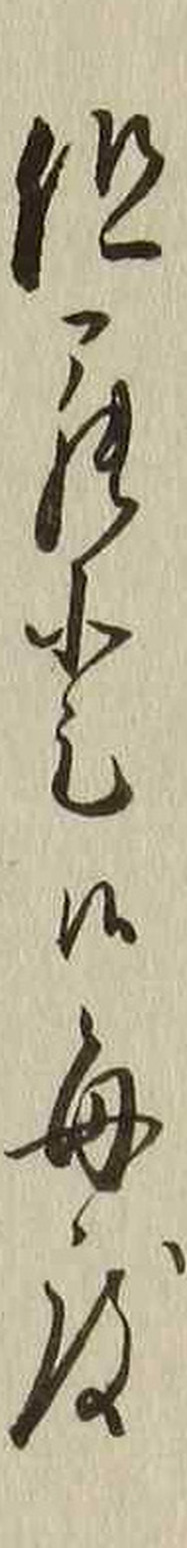但罷登候毎度
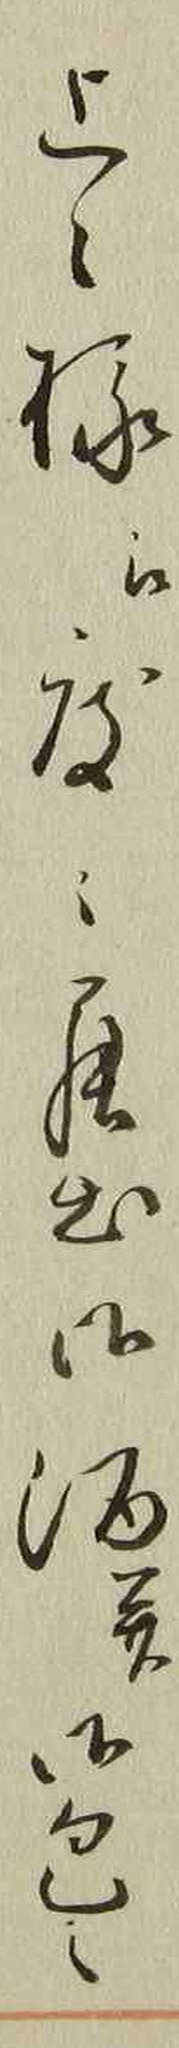上々様江度々罷出御酒并御包之
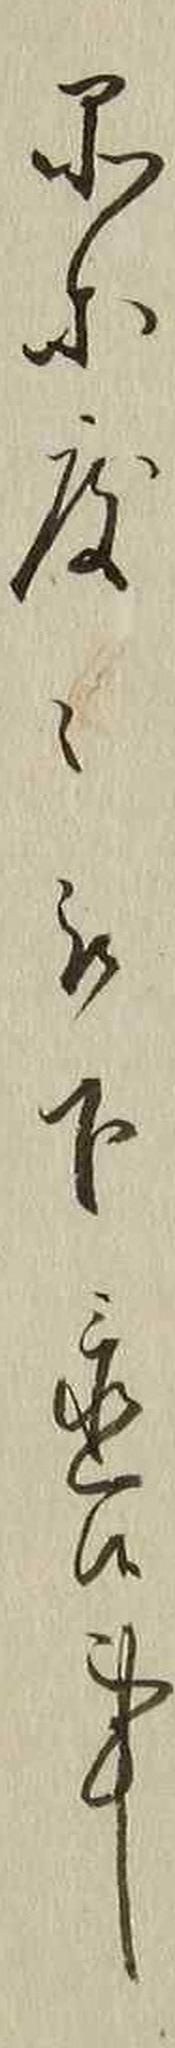品等度々被下置候事
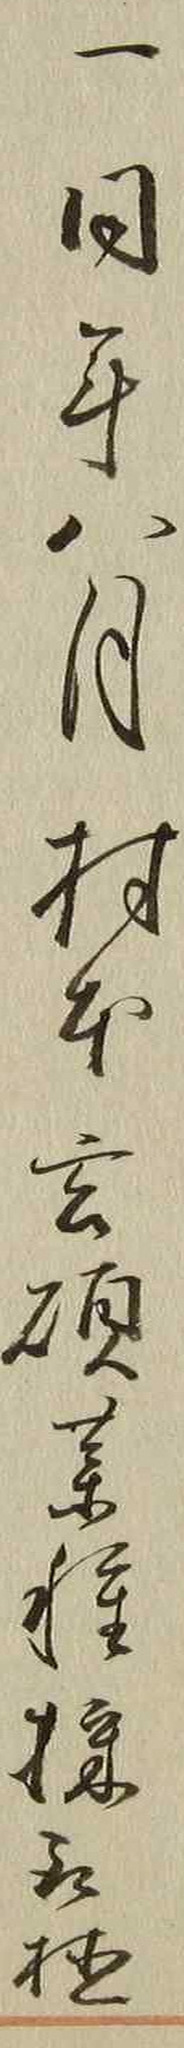一同年八月村本玄碩薬種株取植
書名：諸士系譜　巻之68　を之部2
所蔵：会津若松市立会津図書館
